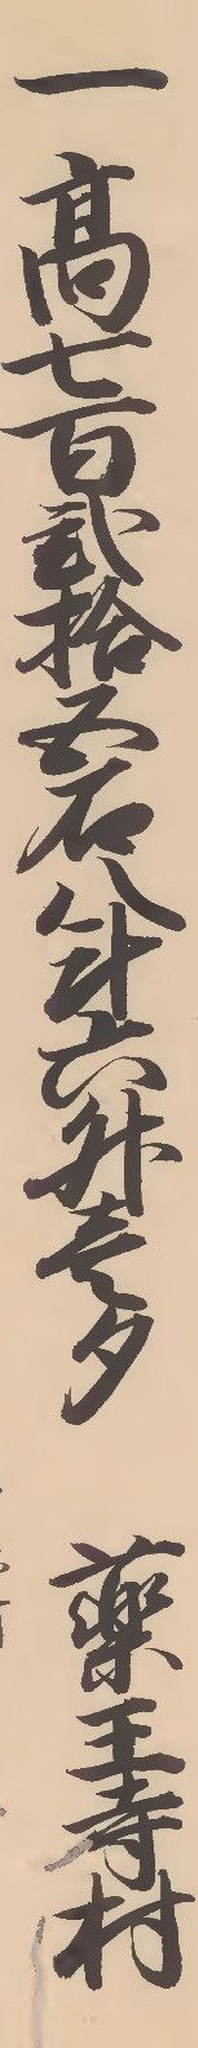一高七百弐拾五石八斗六升壱勺薬王寺村

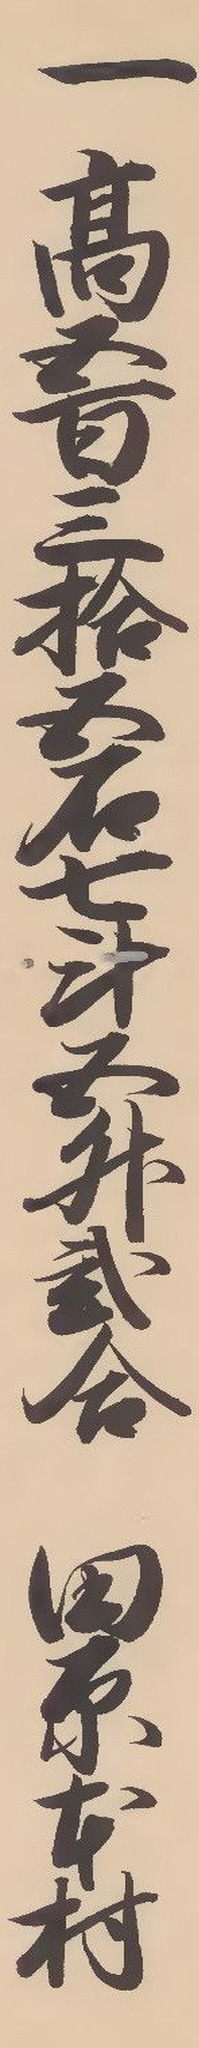一高五百三拾五石七斗五升弐合田原本村
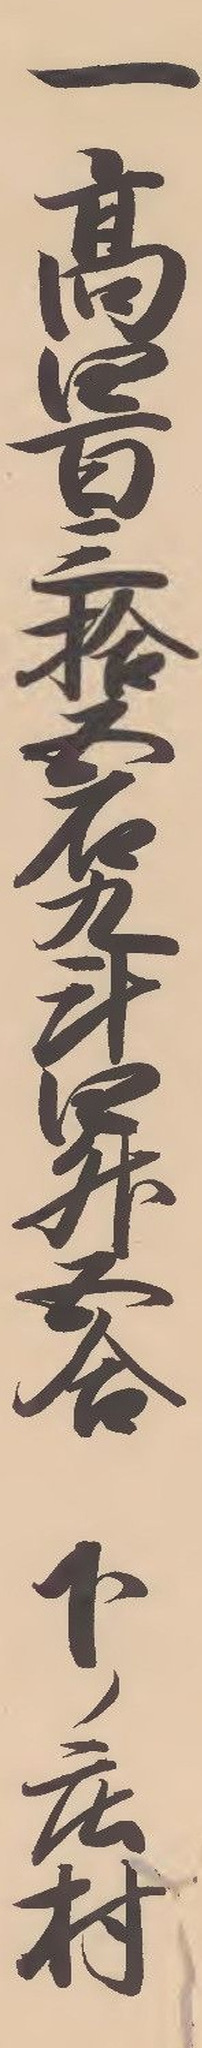一高四百三拾五石九斗四升五合下ノ庄村
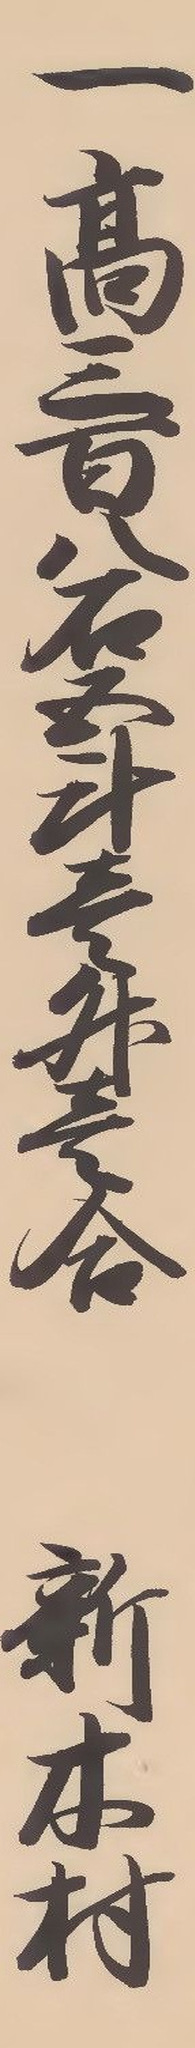一高三百八石五斗壱升壱合新木村
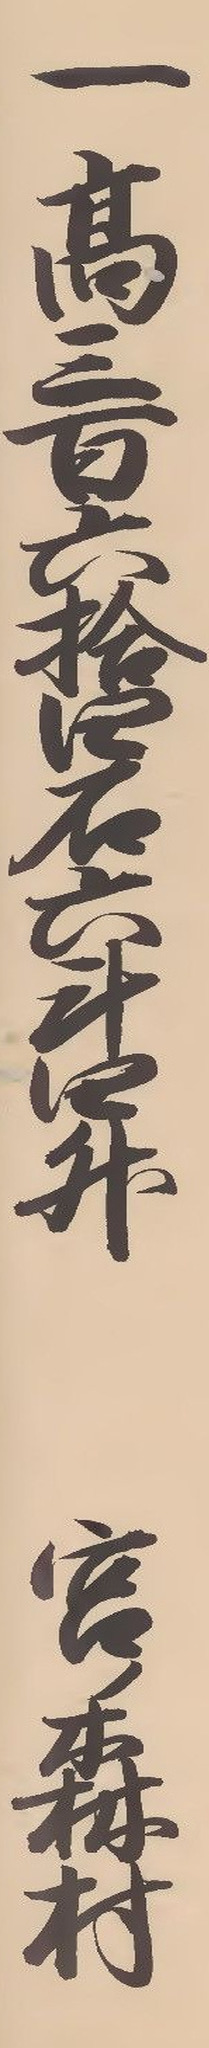一高三百六拾四石六斗四升宮ノ森村
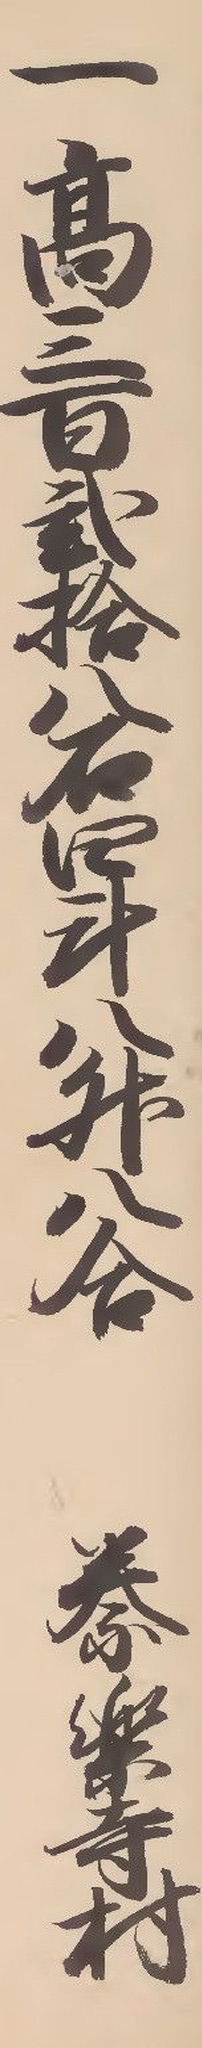一高三百弐拾八石四斗八升八合秦楽寺村
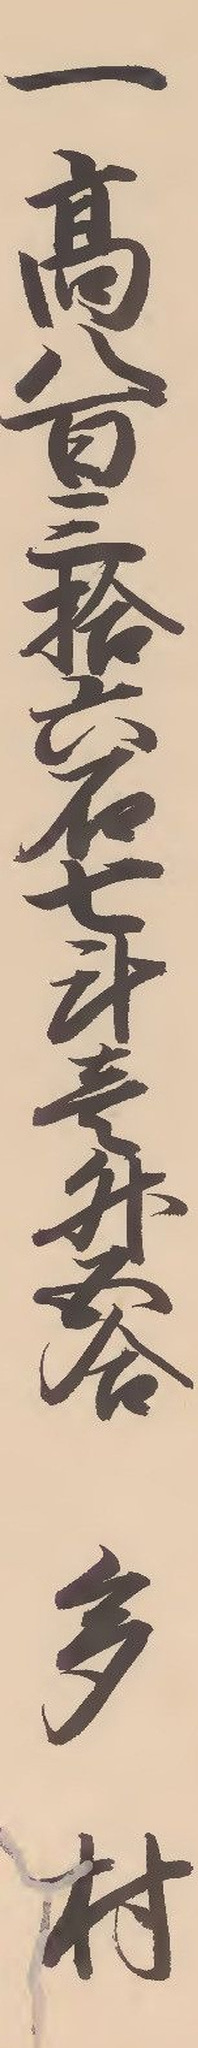一高八百三拾六石七斗壱升五合多村

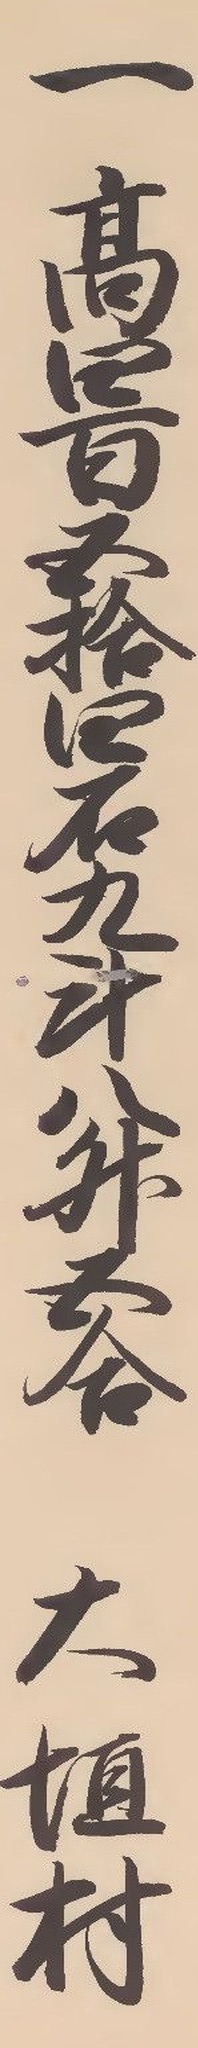一高四百五拾四石九斗八升五合大垣村
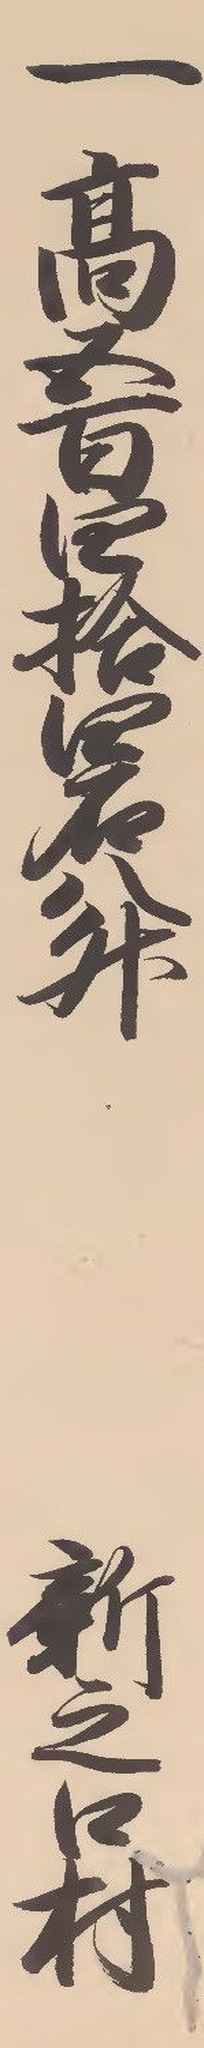一高五百四拾四石八升新之口村
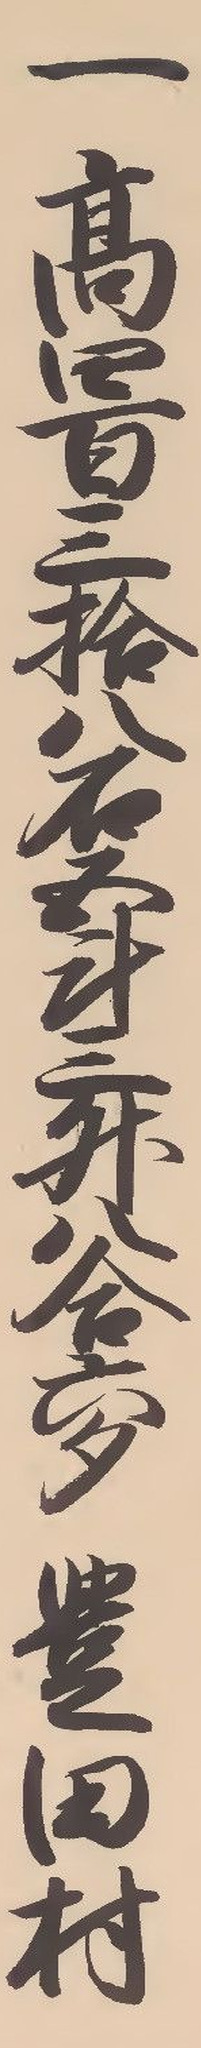一高四百三拾八石五斗三升八合六勺豊田村
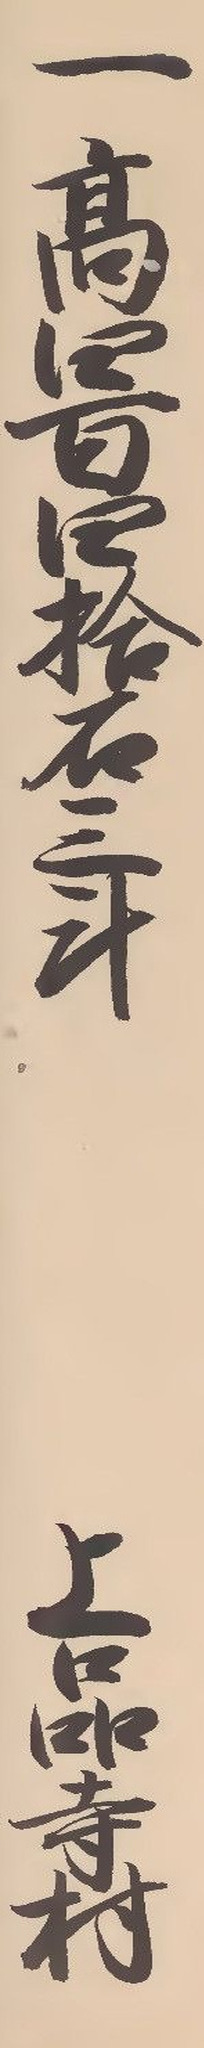一高四百四拾石三斗上品寺村
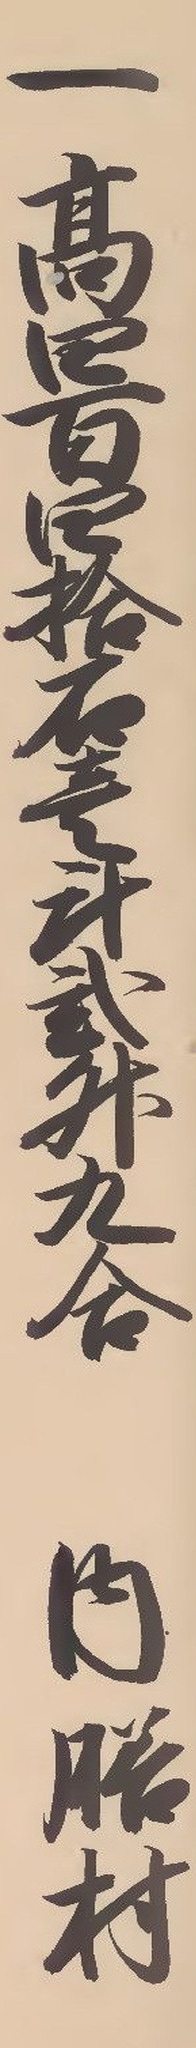一高四百四拾石壱斗弐升九合内膳村
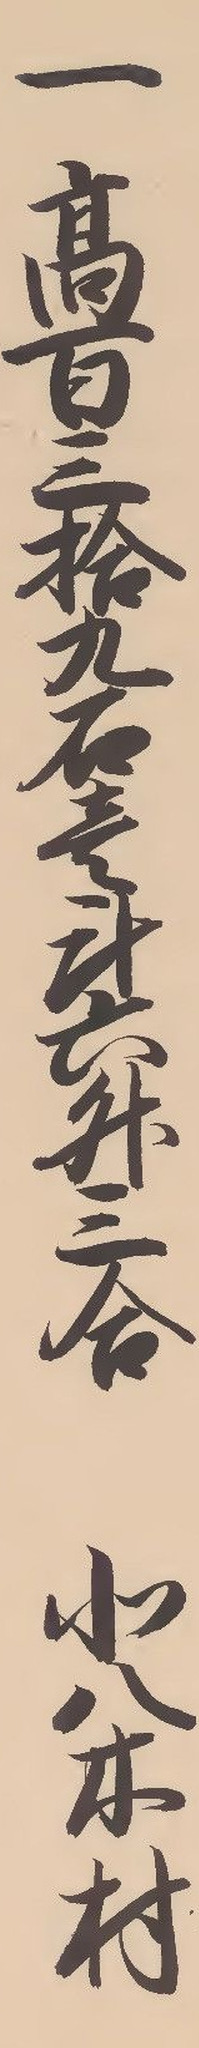一高百三拾九石壱斗六升三合北八木村
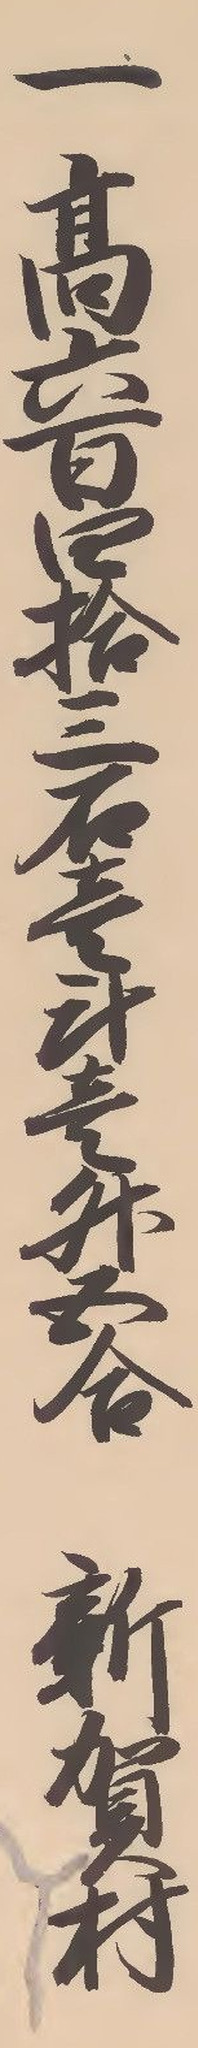一高六百四拾三石壱斗壱升五合新賀村
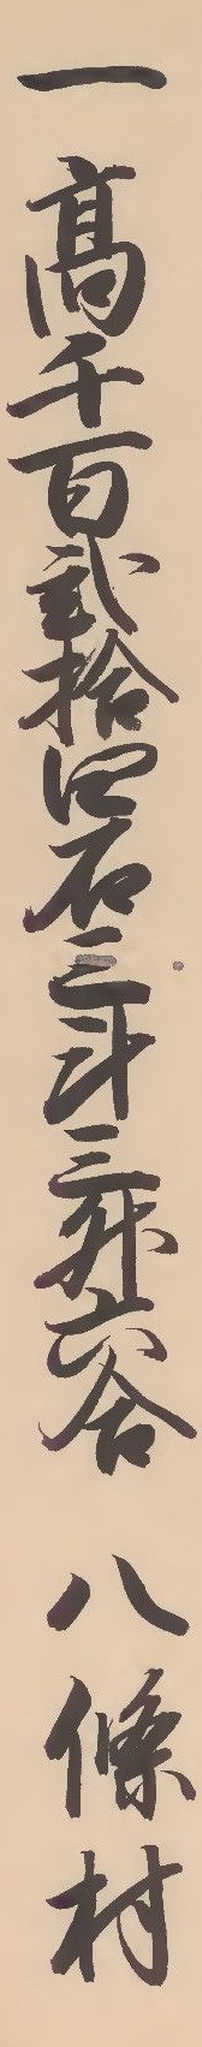一高千百弐拾四石三斗三升六合八条村

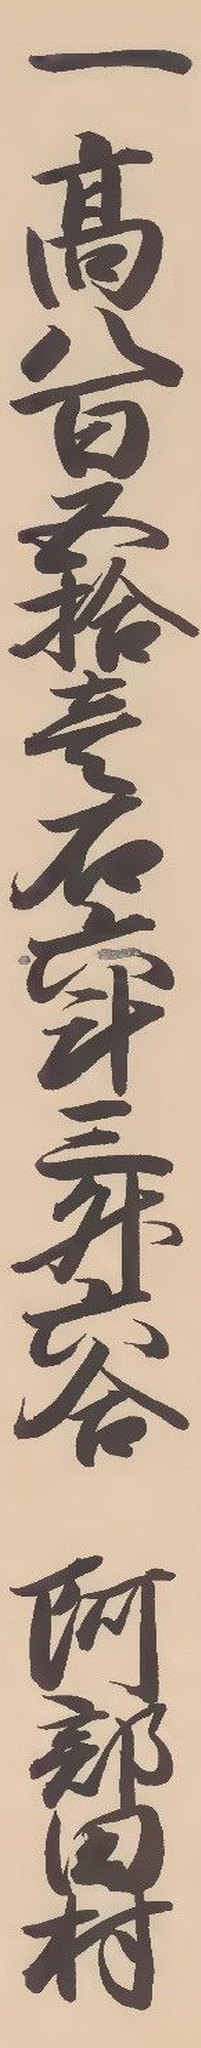一高八百五拾壱石六斗三升六合阿部田村
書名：大和国郷帳
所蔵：国立公文書館 National Archives of Japan
